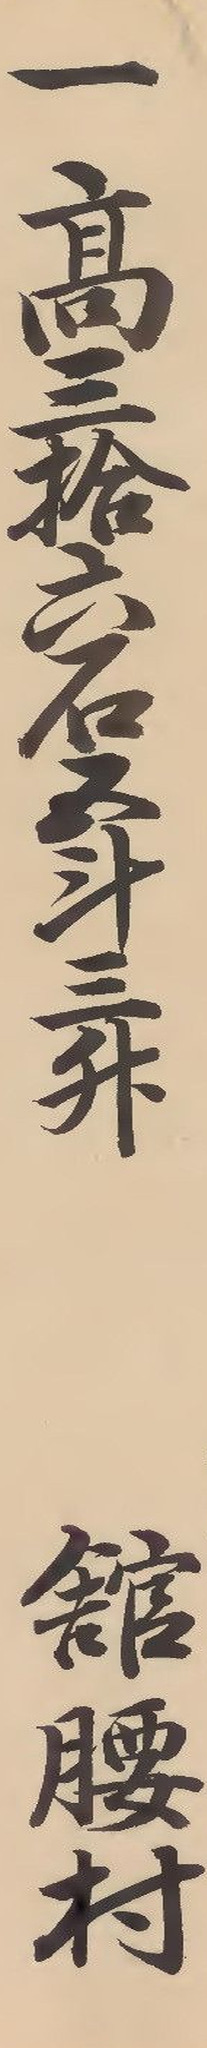一高三拾六石五斗三升館腰村
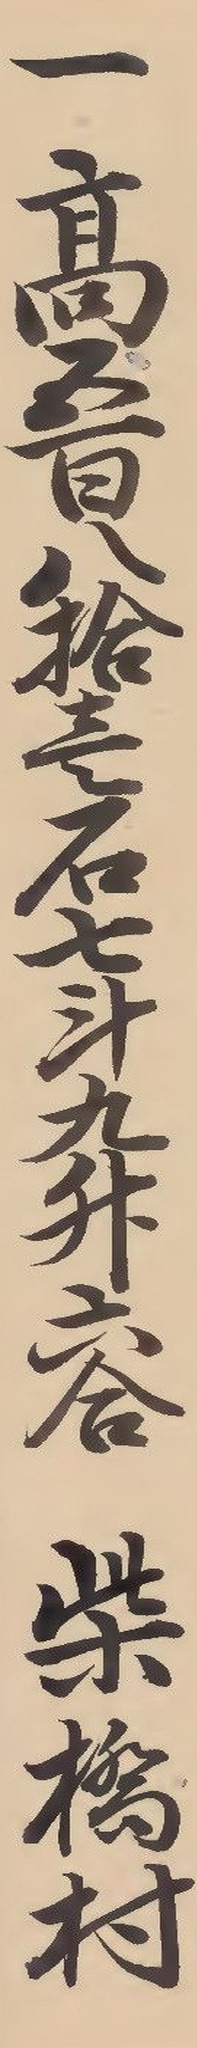一高五百八拾壱石七斗九升六合柴橋村
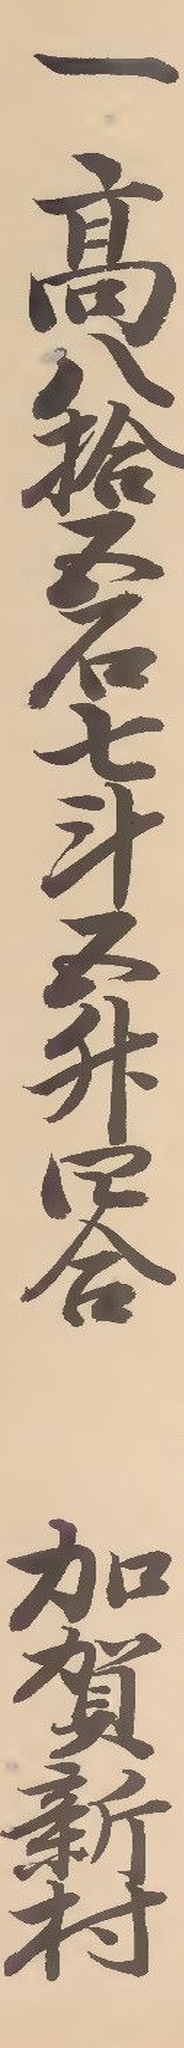一高八拾五石七斗五升四合加賀新村
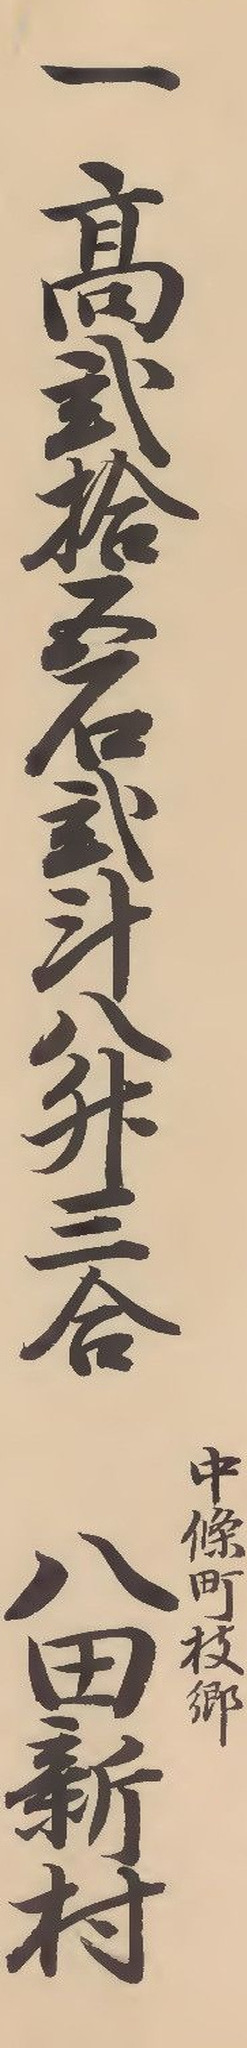一高弐拾五石弐斗八升三合八田新村
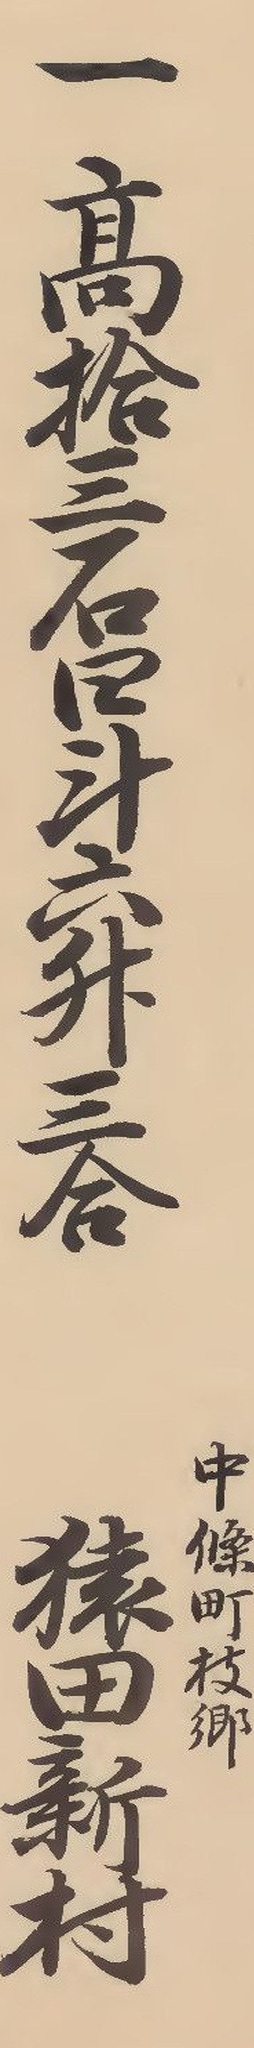一高拾三石四斗六升三合猿田新村
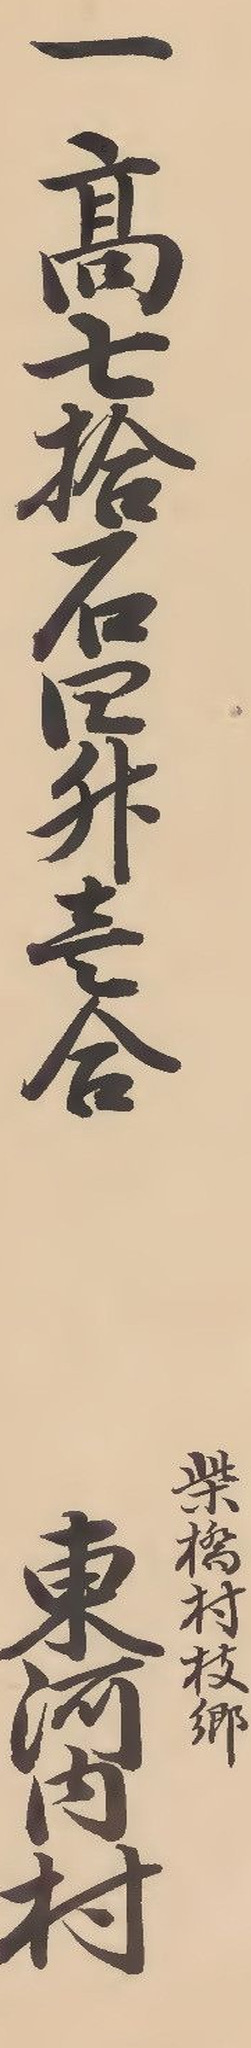一高七拾石四升壱合東河内村

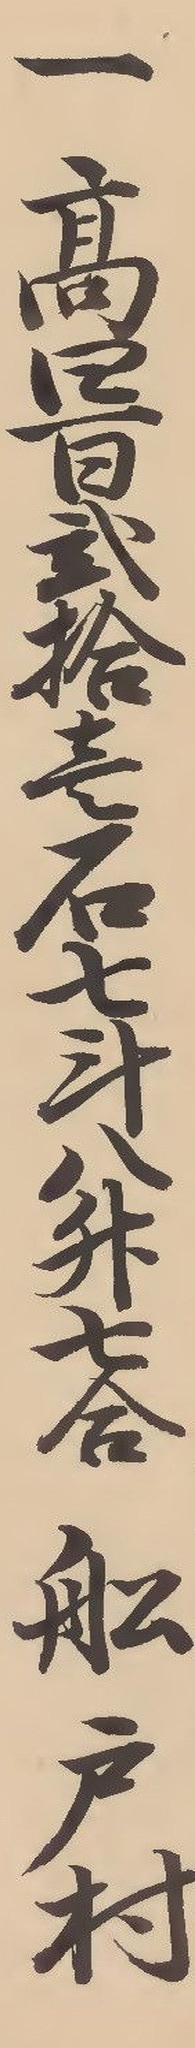一高四百弐拾壱石七斗八升七合船戸村
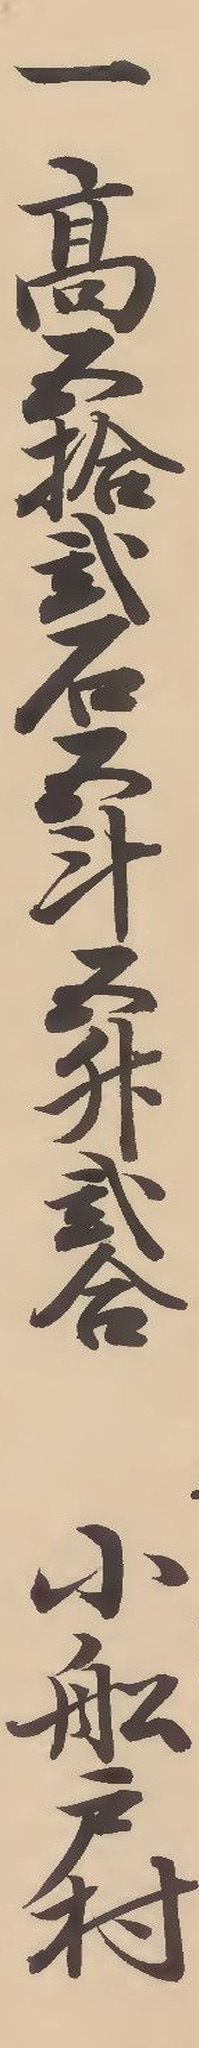一高五拾弐石五斗五升弐合小船戸村
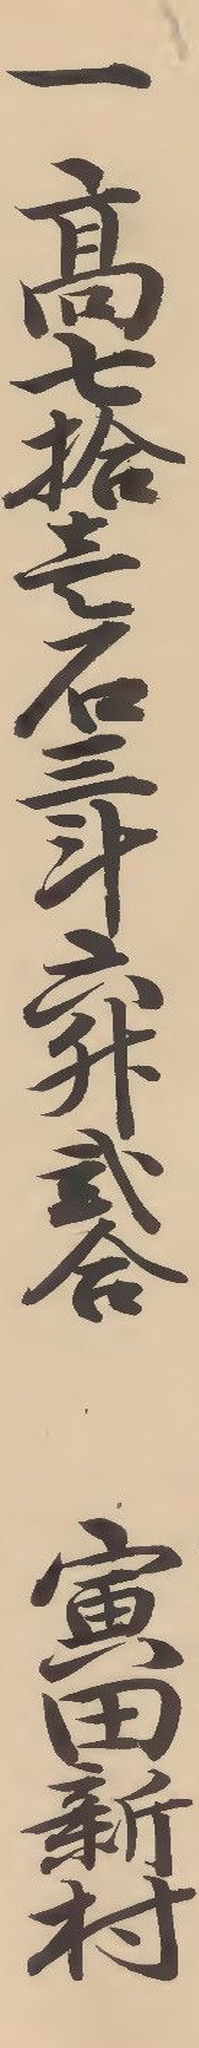一高七拾壱石三斗六升弐合寅田新村
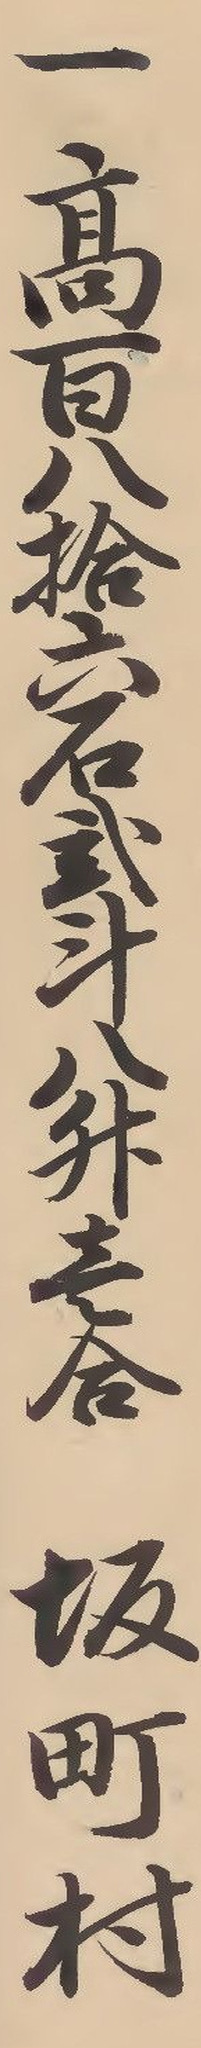一高百八拾六石弐斗八升壱合坂町村
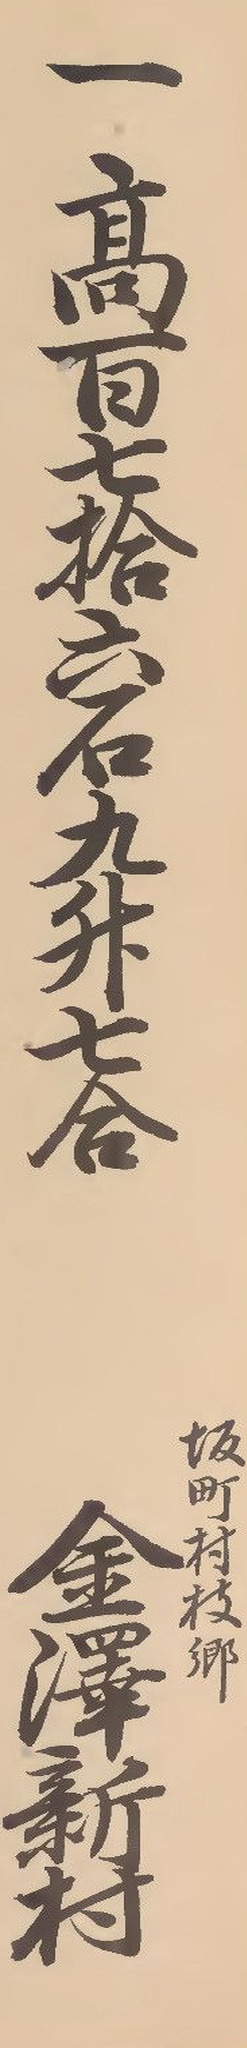一高百七拾六石九升七合金沢新村
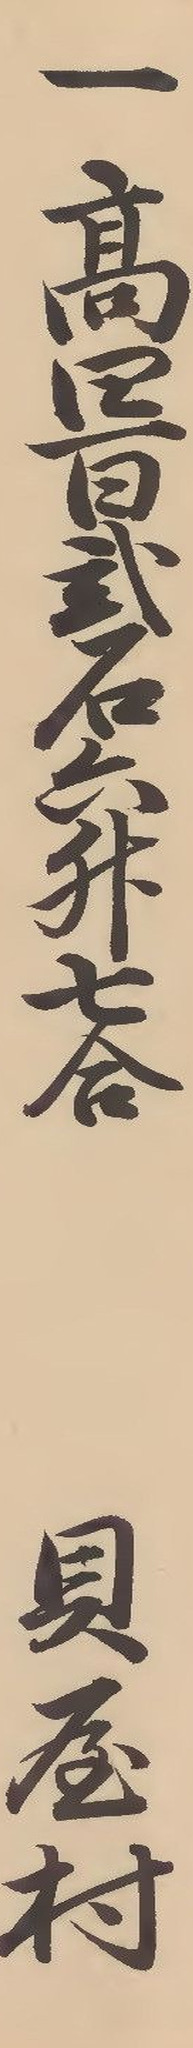一高四百弐石六升七合貝屋村
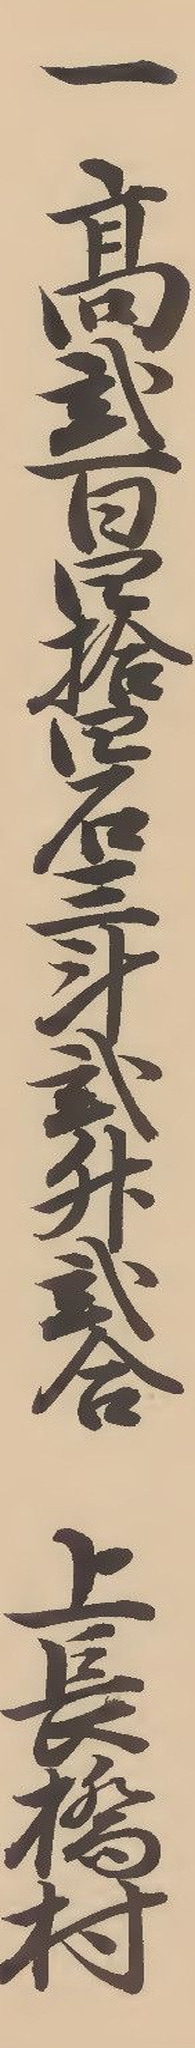一高弐百四拾四石三斗弐升弐合上長橋村
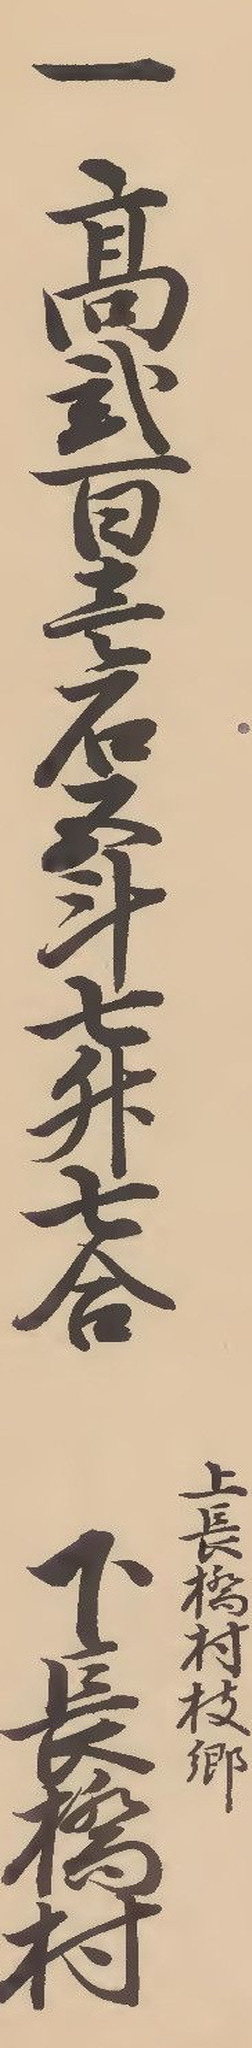一高弐百壱石五斗七升七合下長橋村

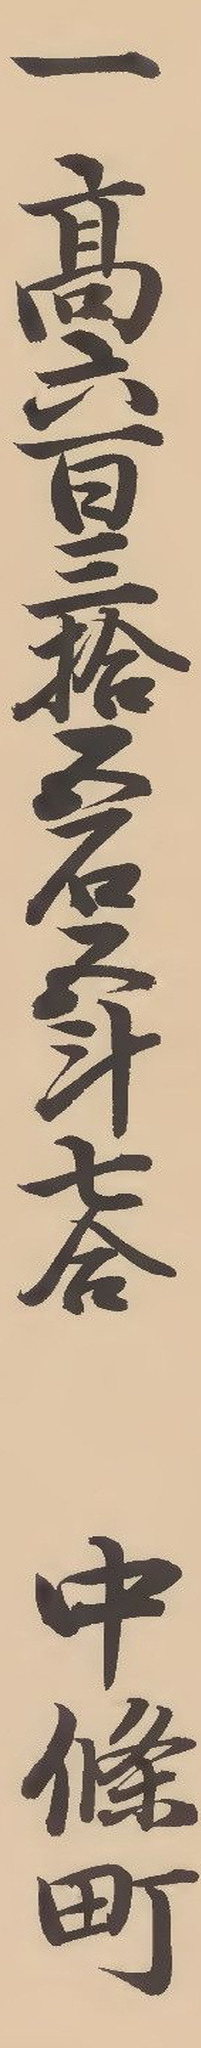一高六百三拾五石五斗七合中条町
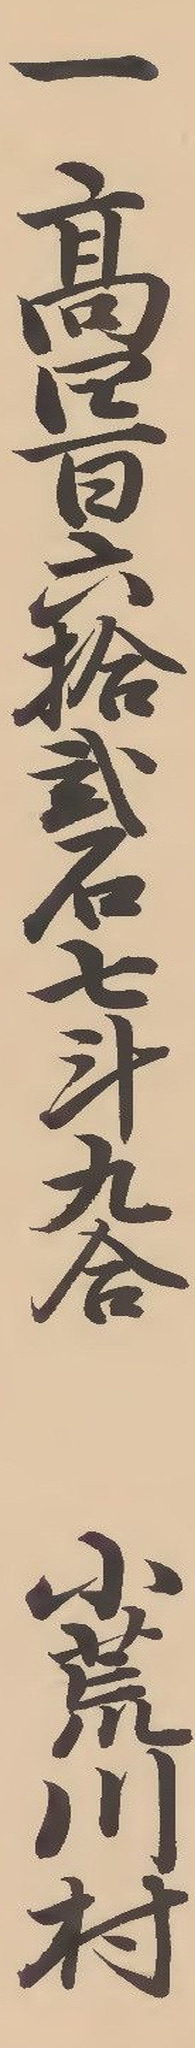一高四百六拾弐石七斗九合小荒川村
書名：越後国郷帳　下
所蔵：国立公文書館 National Archives of Japan
